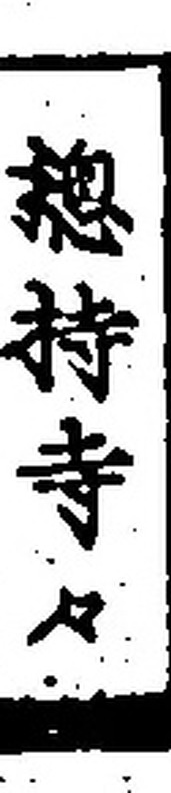総持寺々
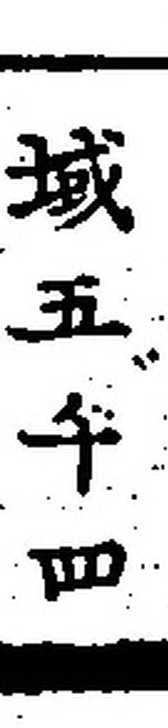域五千四
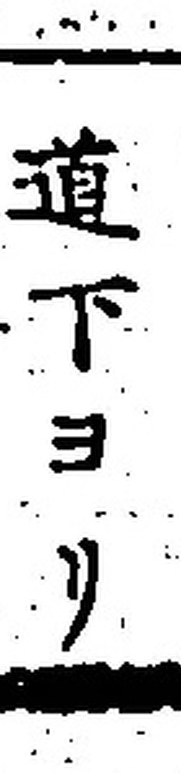道下ヨリ
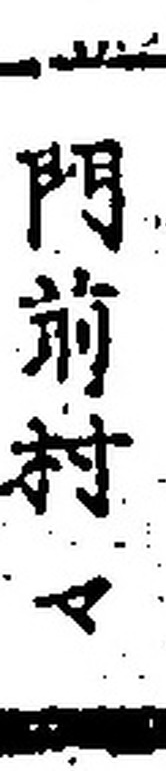門前村マ
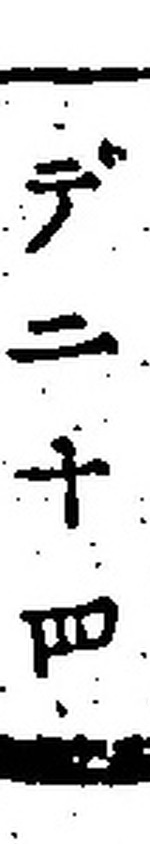デ二十四
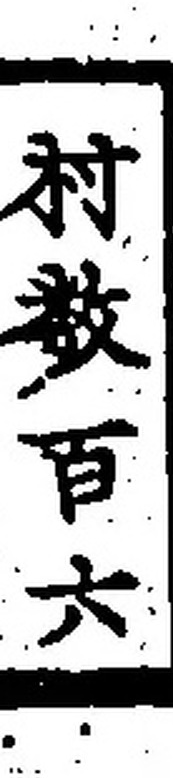村数百六
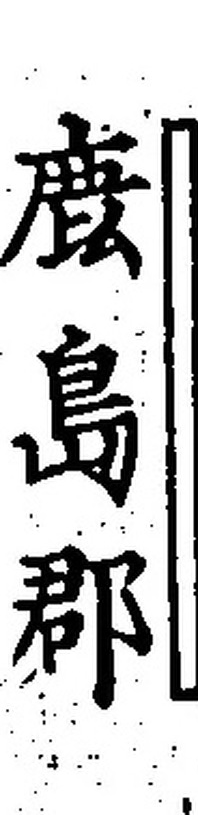鹿島郡
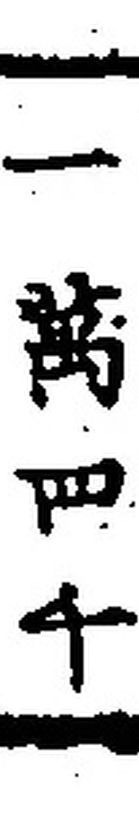一万四千
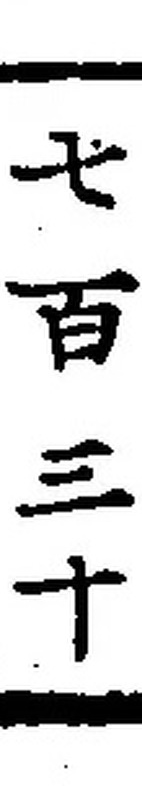七百三十
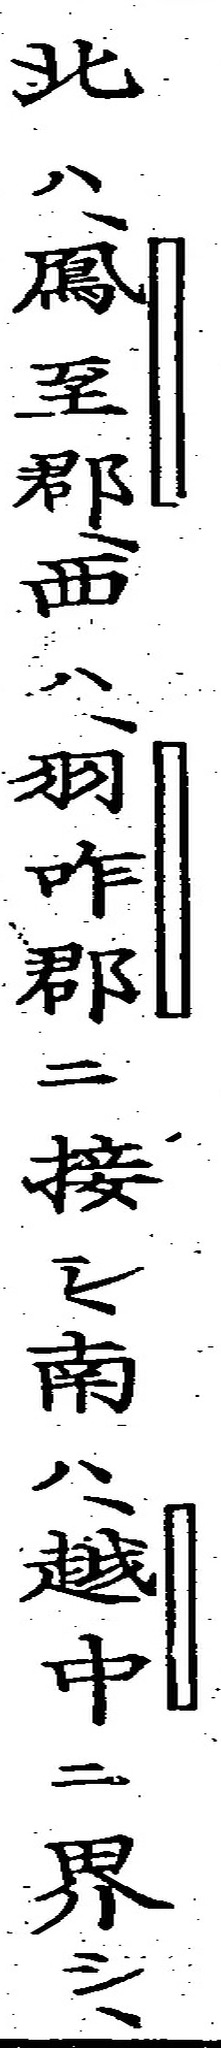北ハ、鳳至郡、西ハ、羽咋郡ニ接シ、南ハ、越中ニ界シ、
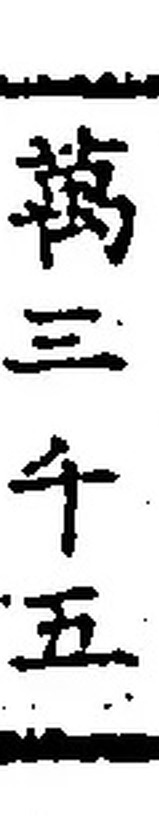万三千五
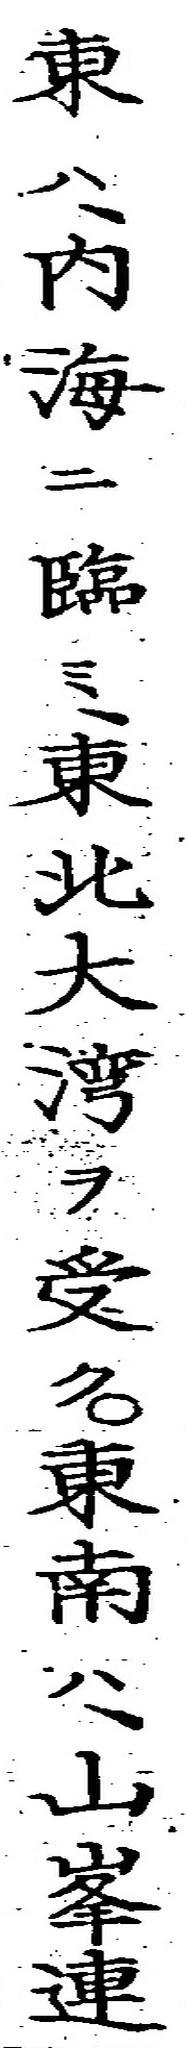東ハ、内海ニ臨ミ、東北大湾ヲ受ク。東南ハ、山峯連
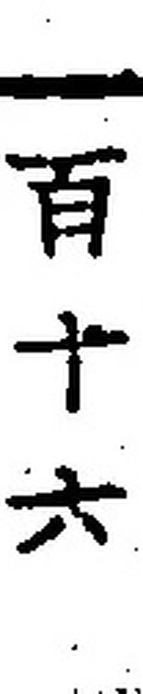百十六
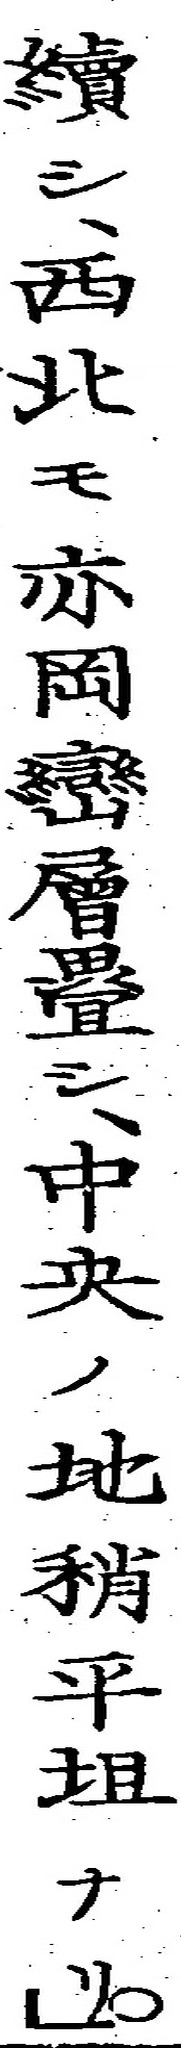続シ、西北モ亦岡巒層畳シ、中央ノ地稍平坦ナリ。」
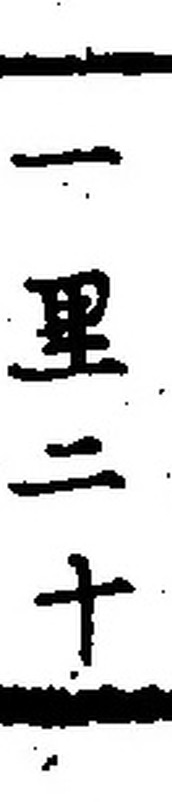一里二十
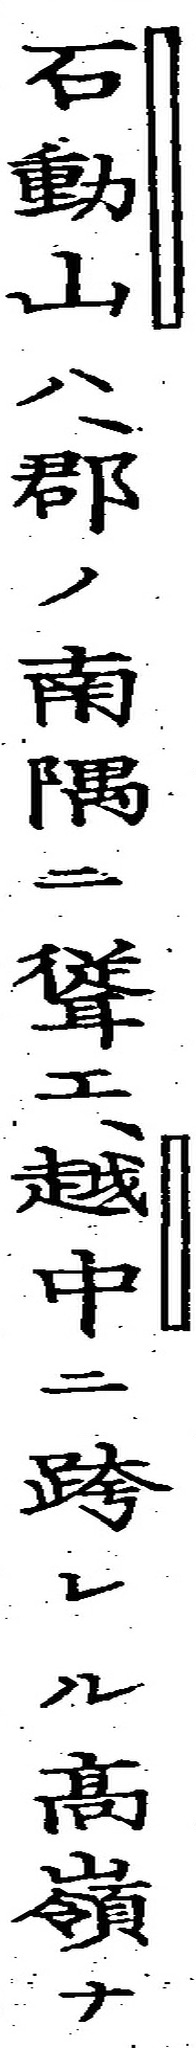石動山ハ、郡ノ南隅ニ聳エ、越中ニ跨レル高嶺ナ
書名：能登地誌略
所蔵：国立国会図書館 National Diet Library, JAPAN
